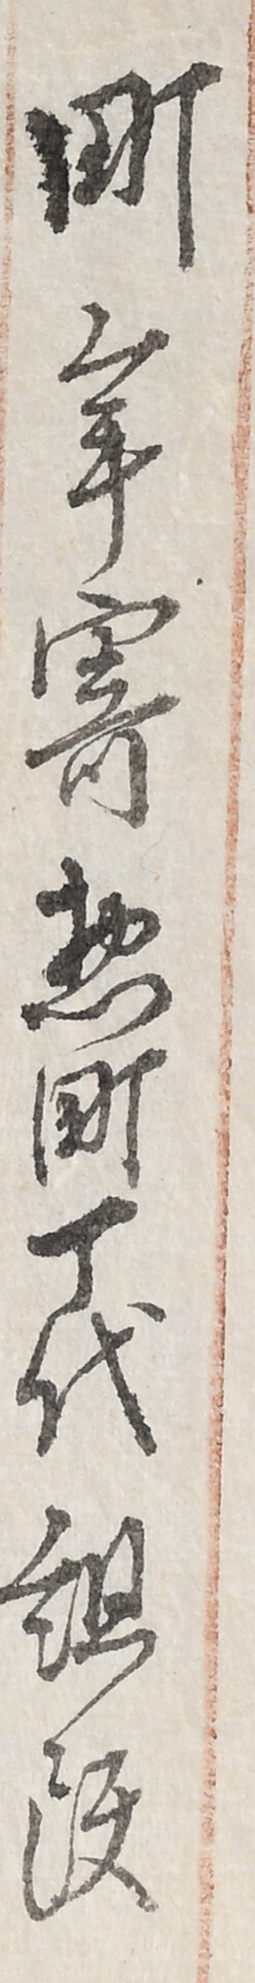町年寄惣町丁代組頭
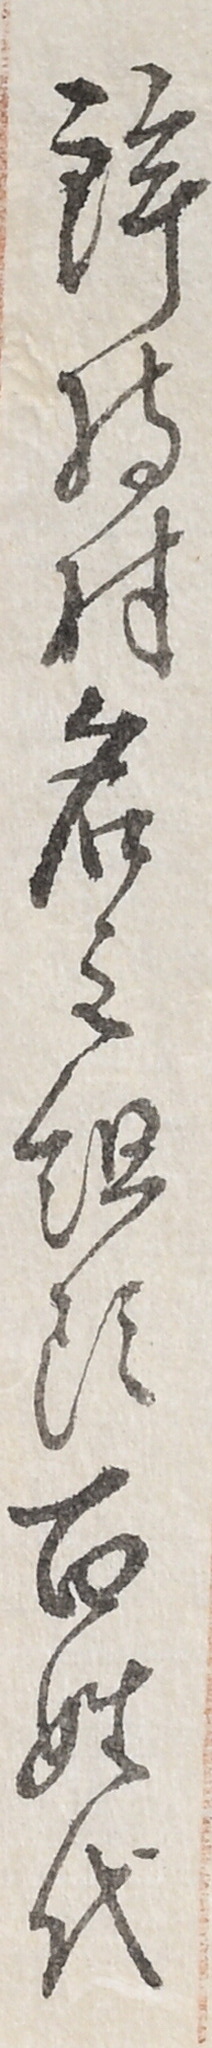鉾持村名主組頭百姓代
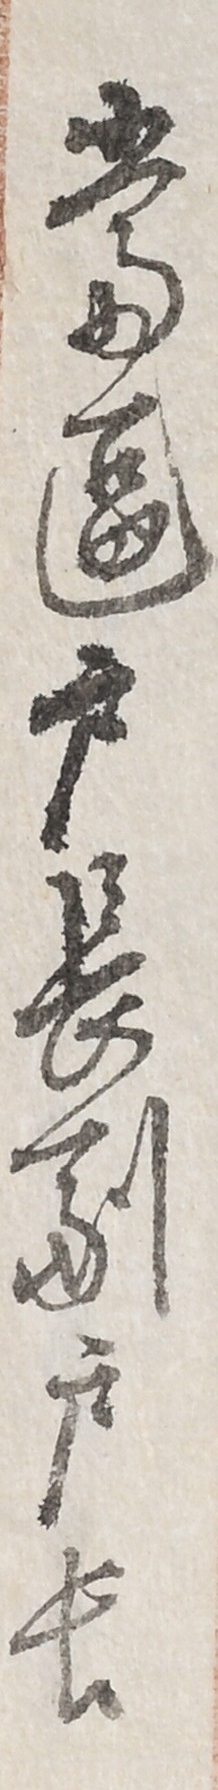当区戸長副戸長
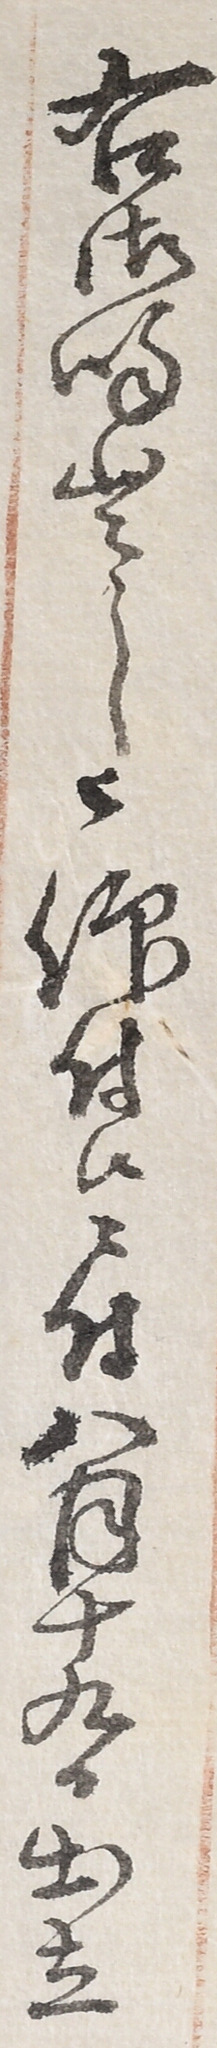右御呼出し被仰付候ニ付八月十九日出立
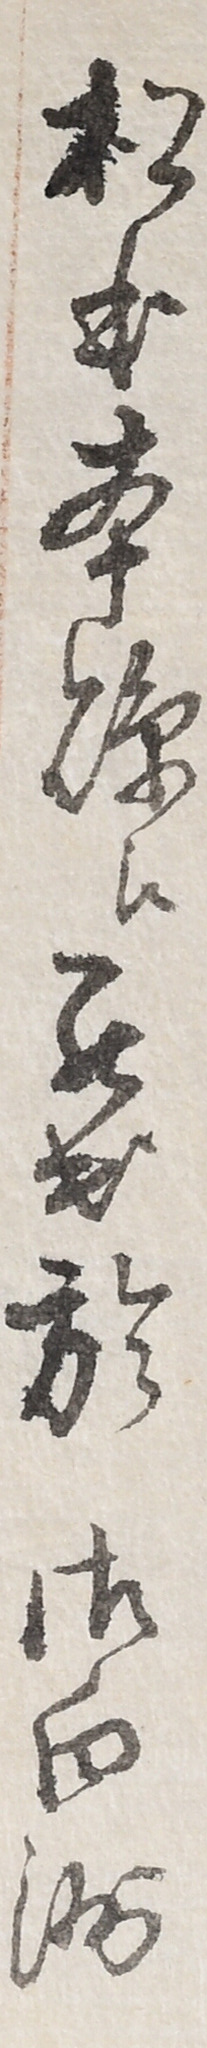松本本県え罷出於御白洲
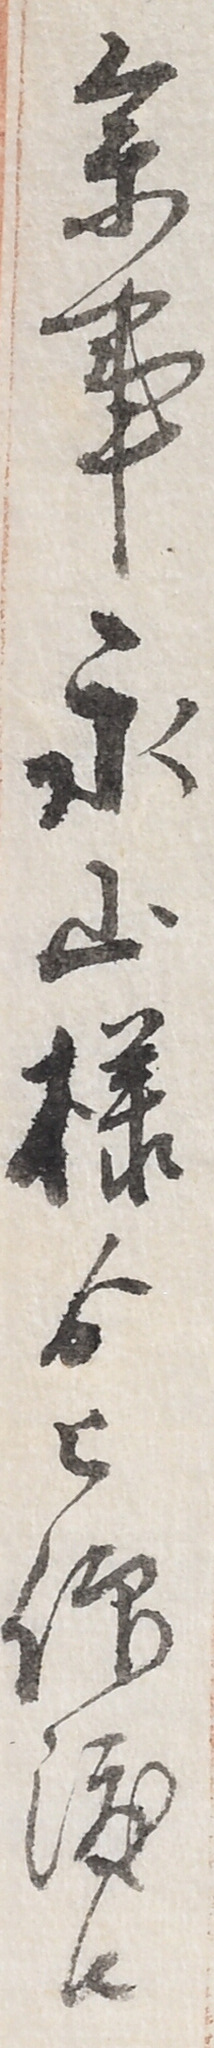参事永山様より被仰渡候
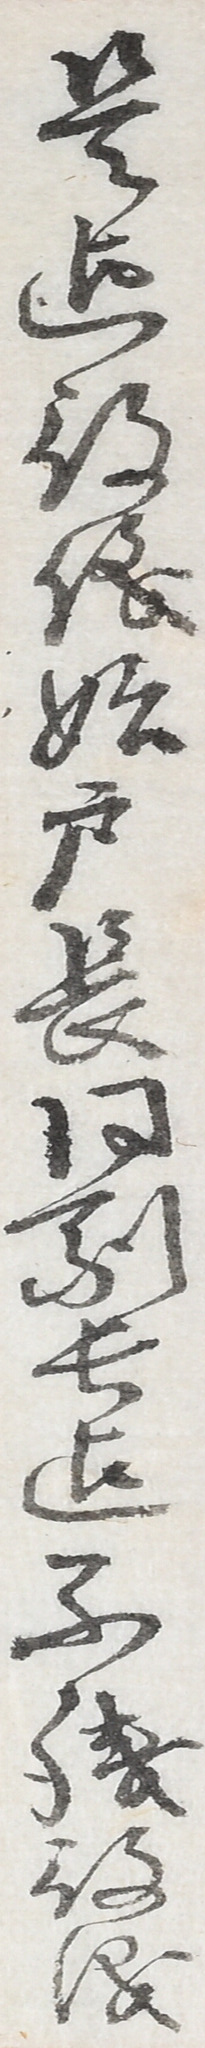是迄役儀始戸長同副長迄不残役儀
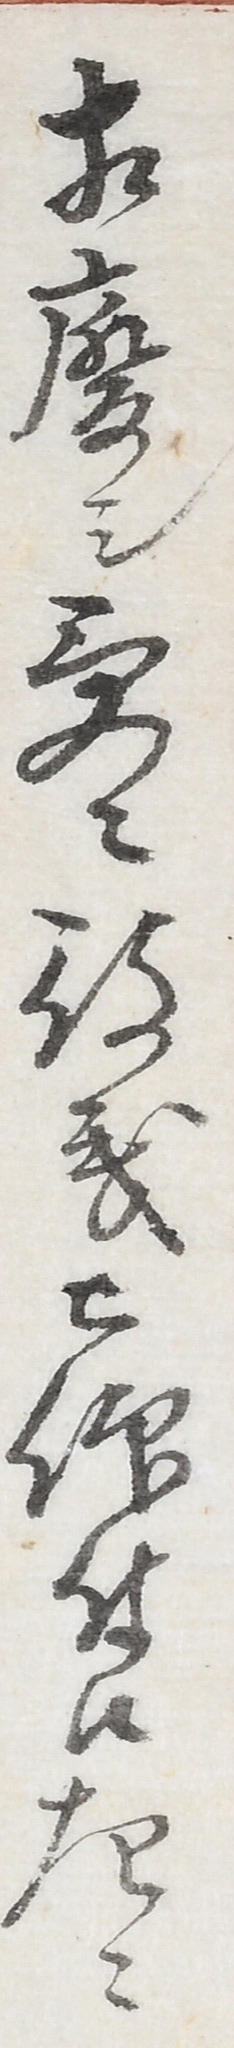相廃シ更ニ役義被仰付候左ニ
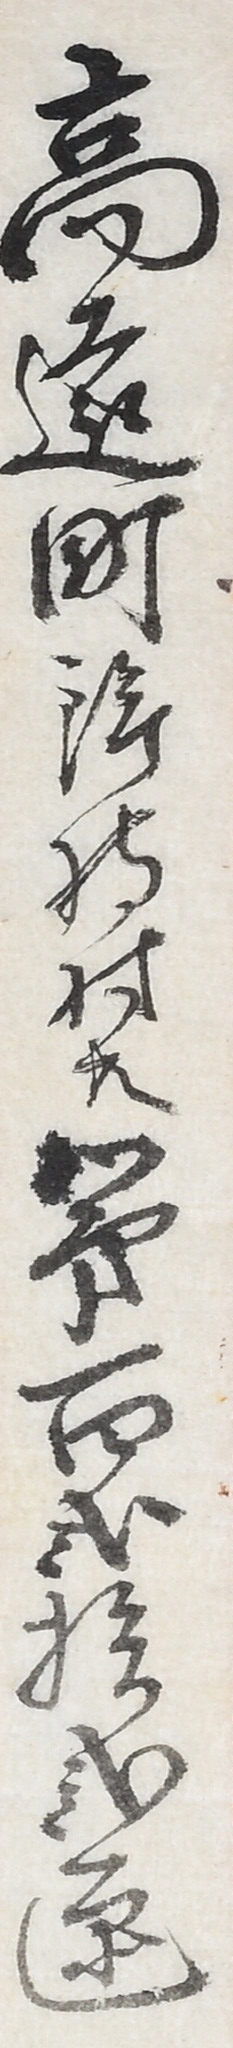高遠町鉾持村共第百弐拾弐区
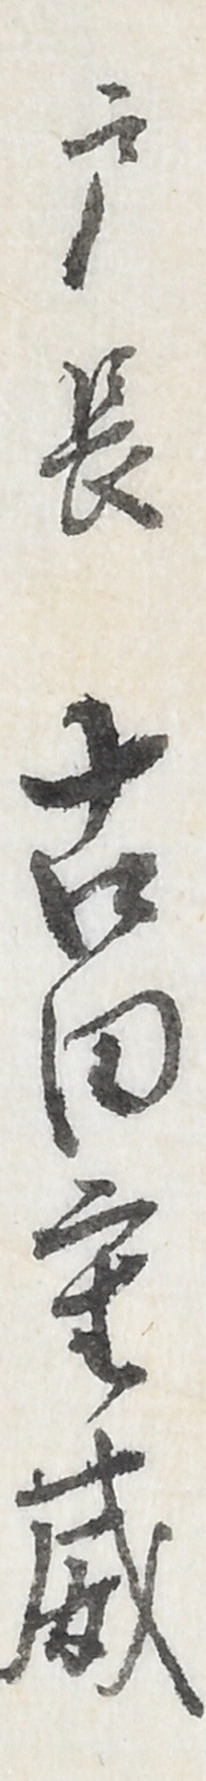戸長古田重威
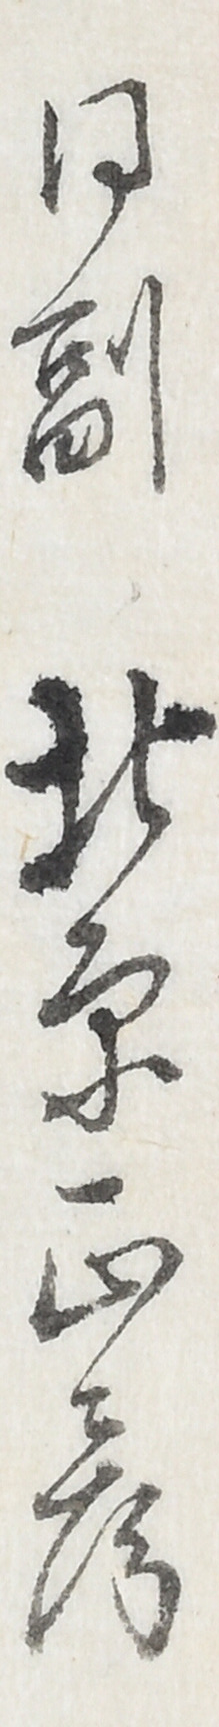同副北原正彦
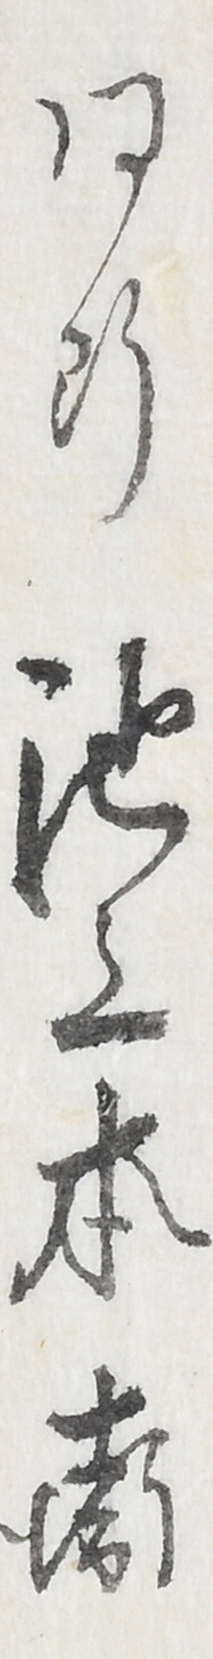同断池上本衛
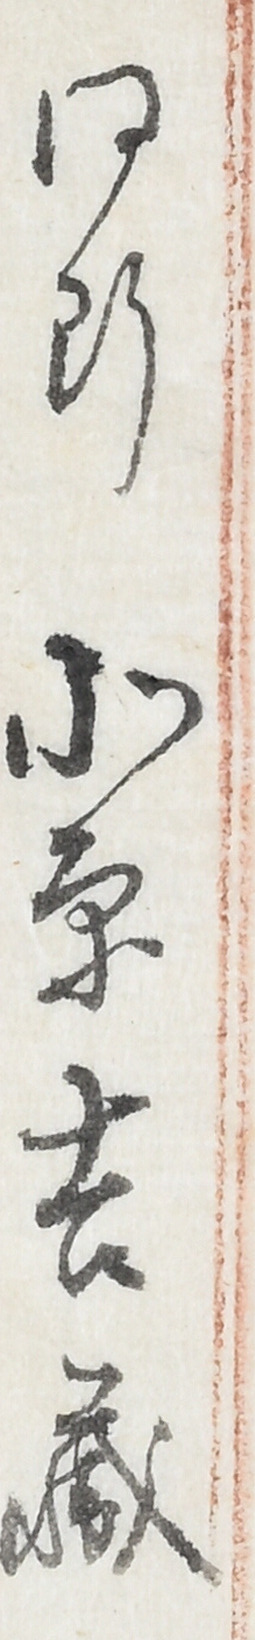同断北原吉蔵
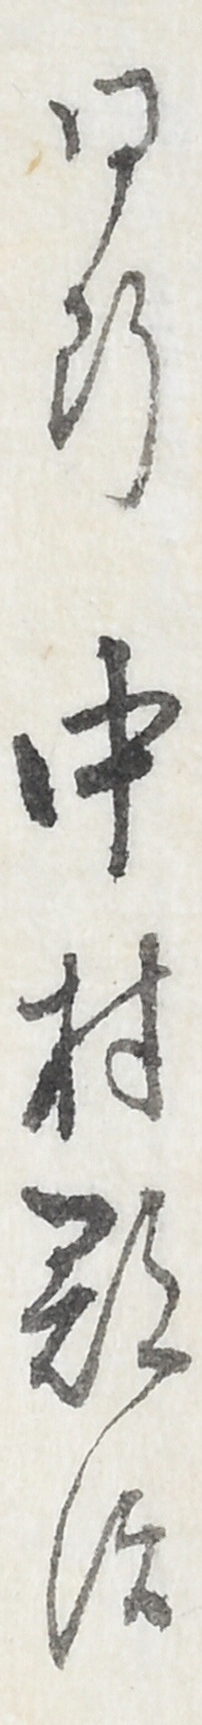同断中村郡治

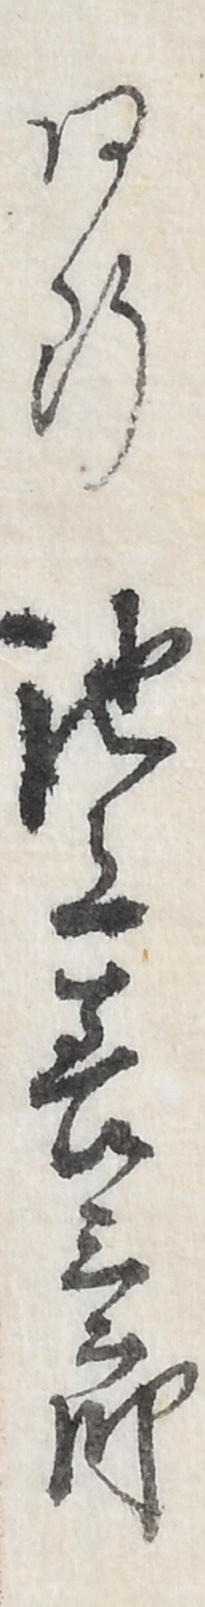同断池上善三郎
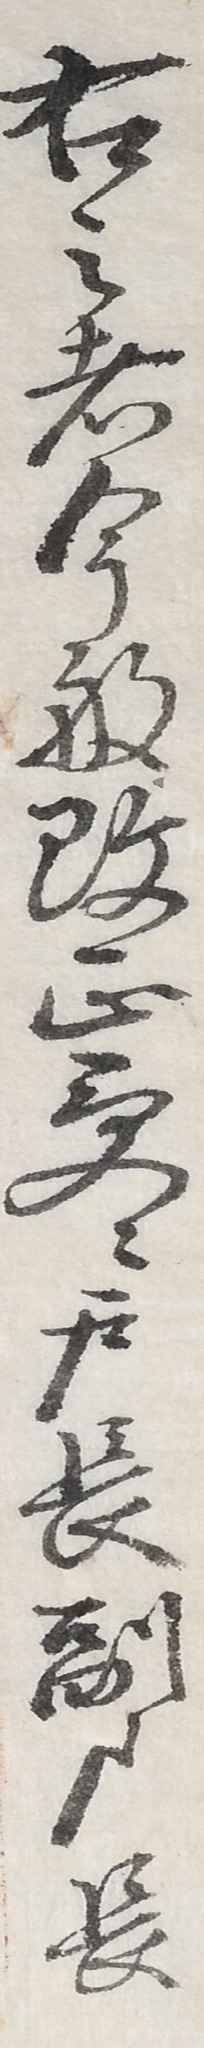右之者今般改正受ニ戸長副戸長
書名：壹番・御布告一式
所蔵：伊那市立高遠町図書館・合同会社AMANE
